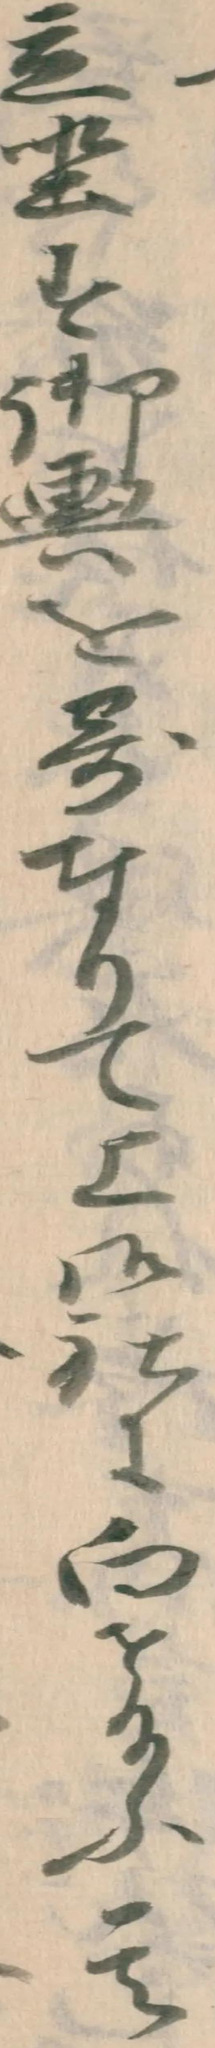立坐す御輿を寄奉りて上御社に向せ給ふ其
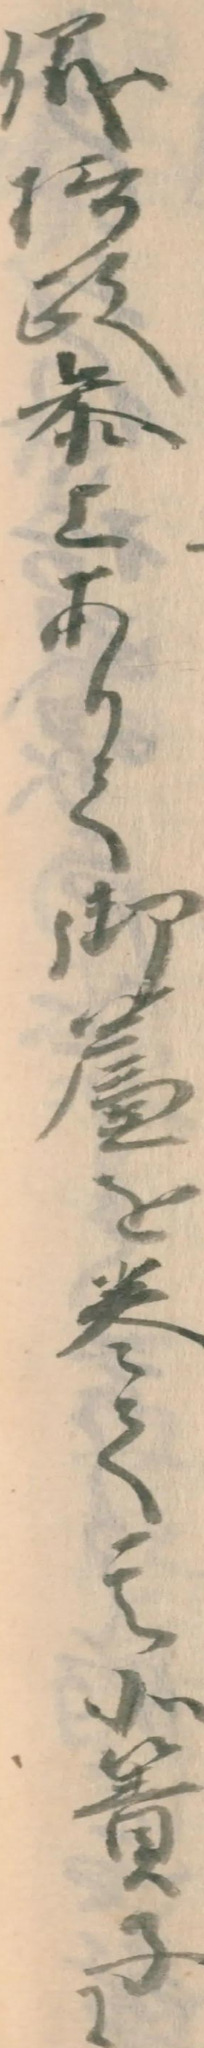儀摂政参上ありて御簾を巻て其北簀子に
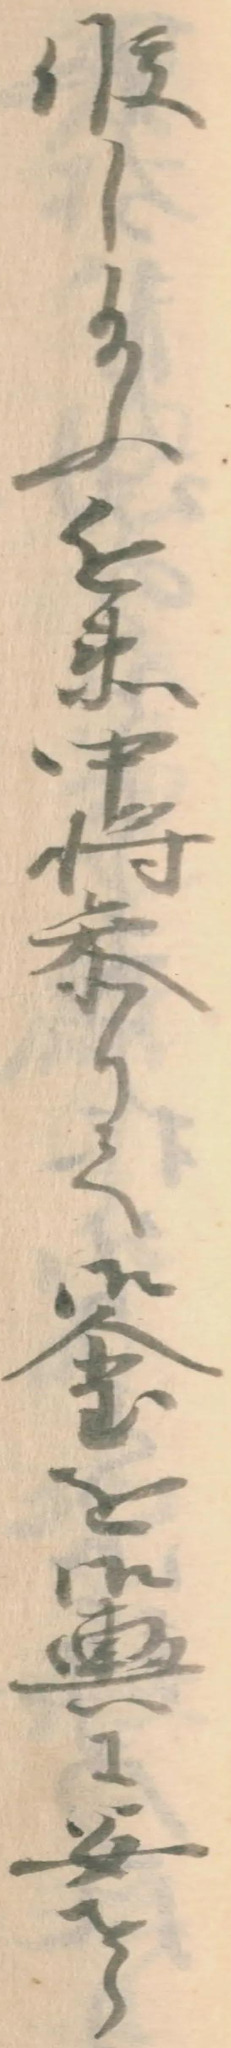候し給ふ近衛中将参りて御璽を御輿に安せら
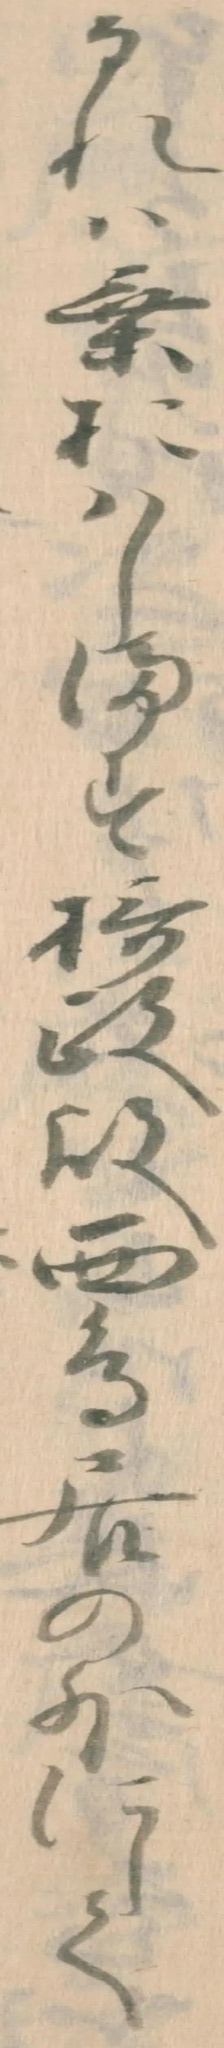るれは乗おはします摂政殿西鳥居の外にして
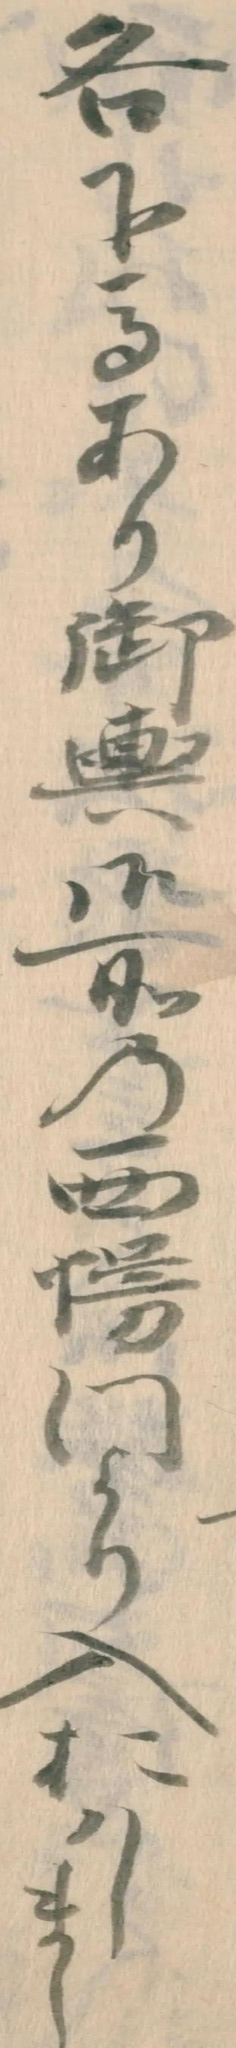各下馬あり御輿御所の西幔門より入おはしまし
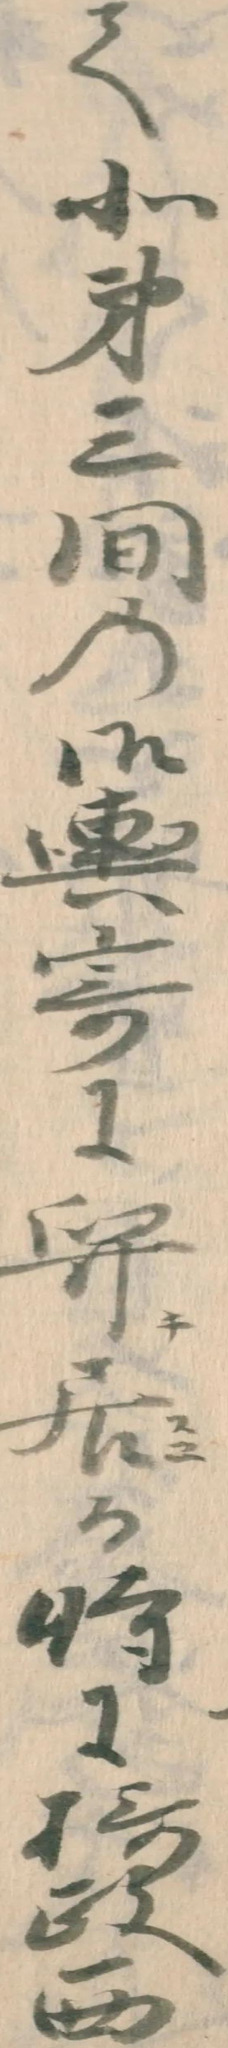て北第三間の御輿寄に舁居る時に摂政西
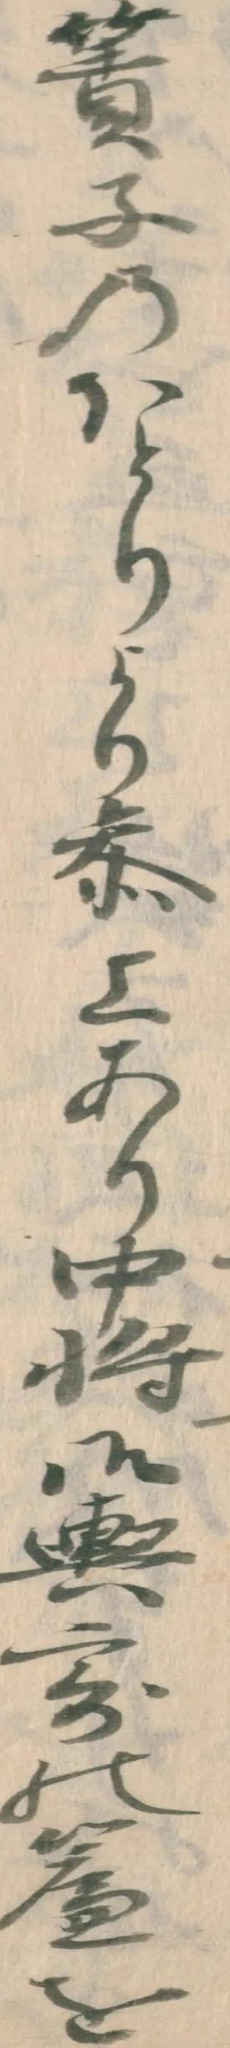簀子のほとりより参上あり中将御輿寄の簾を
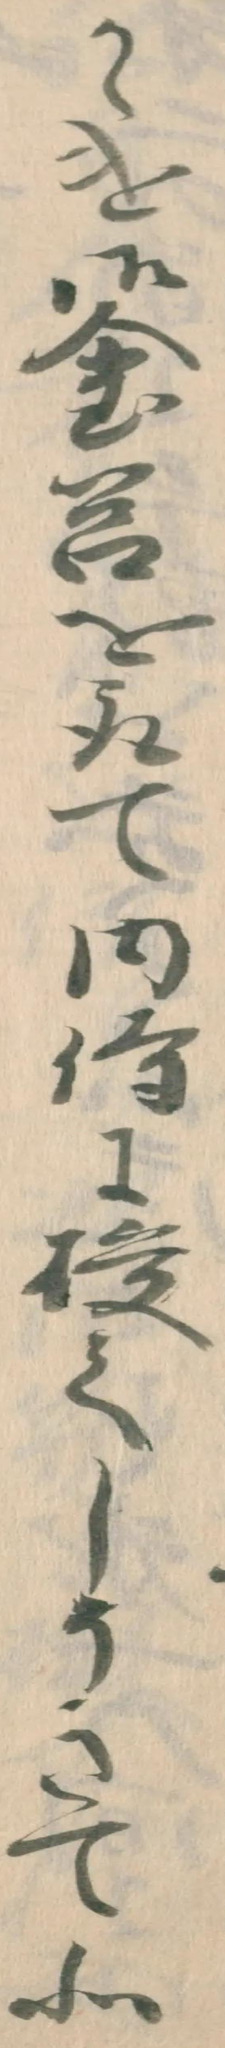かゝけ御璽筥を取て内侍に授てしそきて北
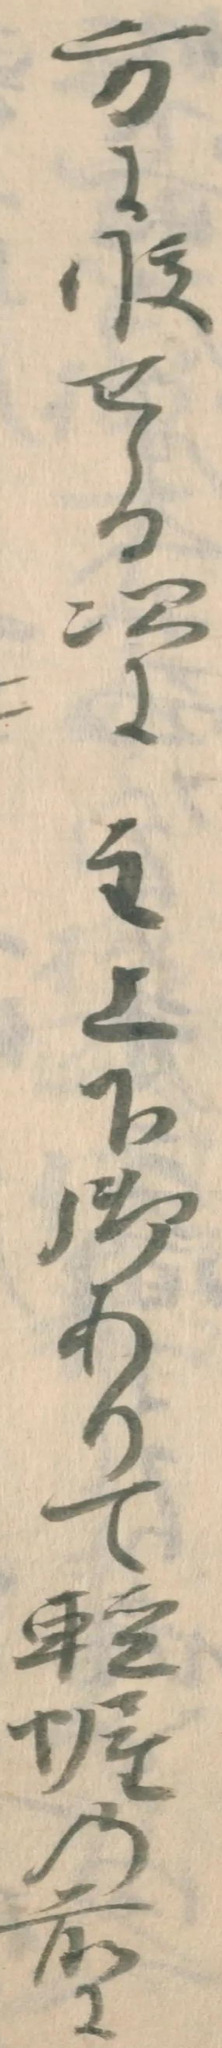方に候せらる次に主上下御ありて軽幄の前に
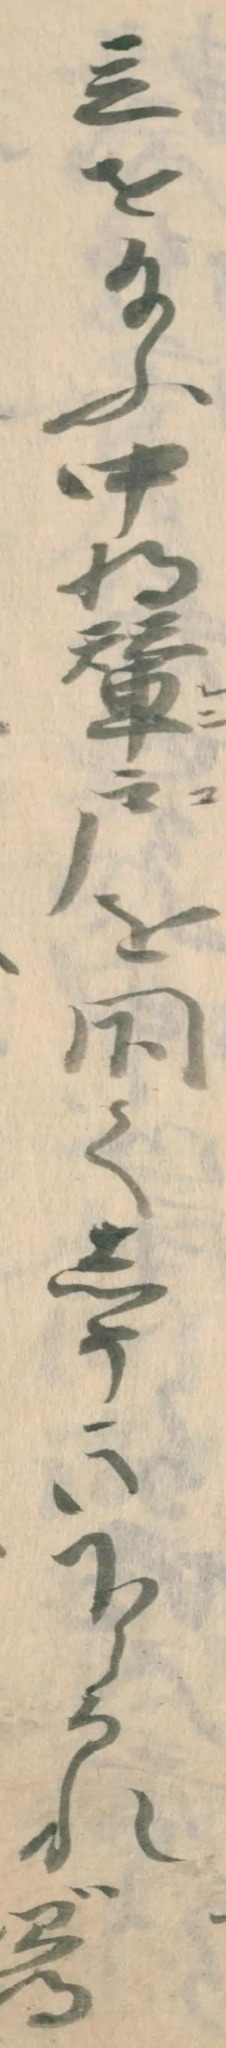立せ給ふ中将輦戸を閇てしそき下らるれば次将
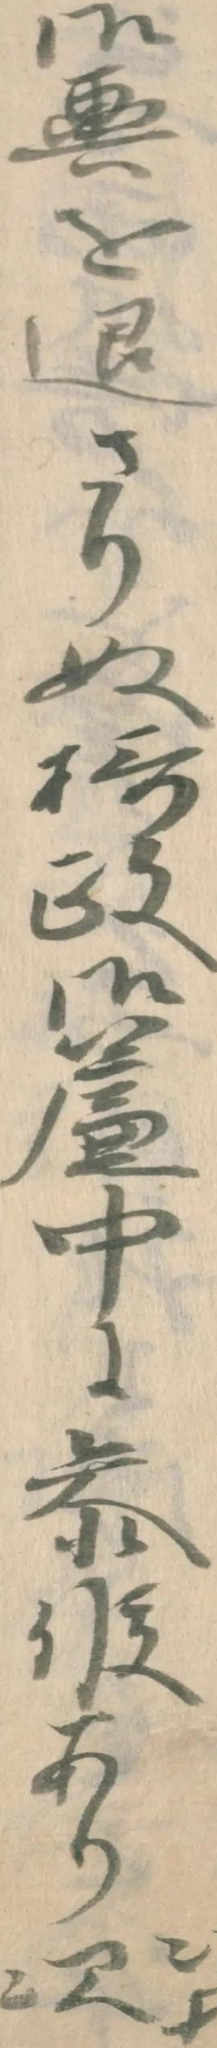御輿を退さりぬ摂政御簾中に参候あり次

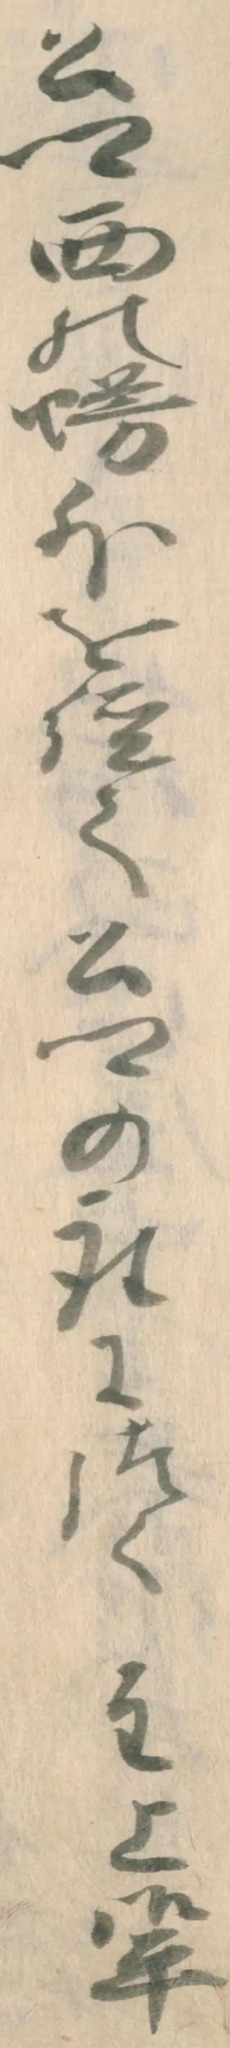公卿西の幔外を経て公卿の座につく主上御平
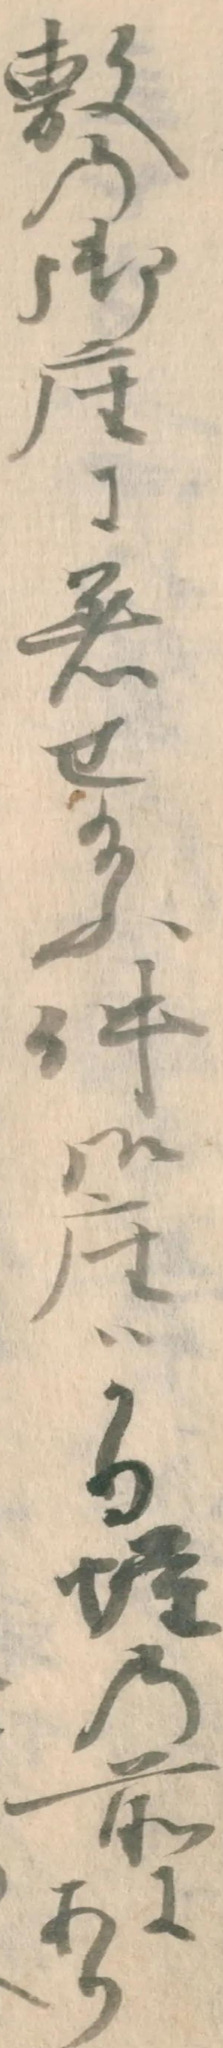敷の御座に着せ給ふ件御座はかる幄の前にあり
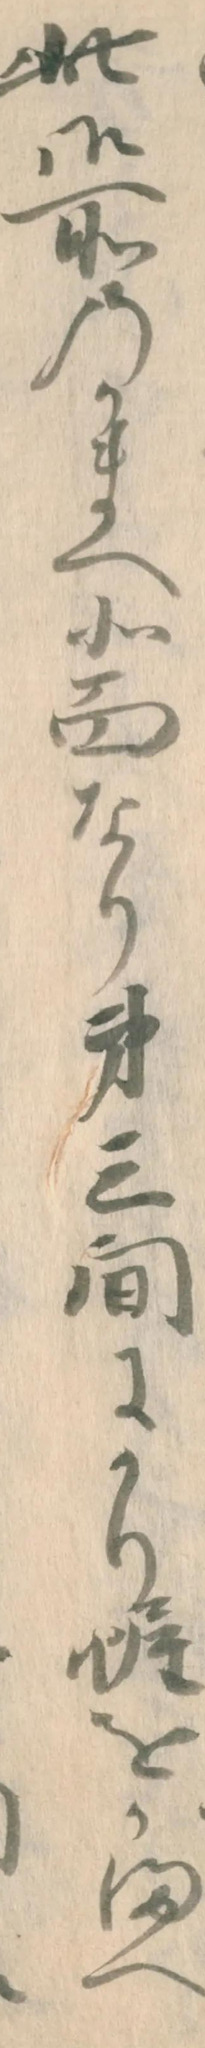此御所のかまへ北面なり第三間にかり幄をかまへ
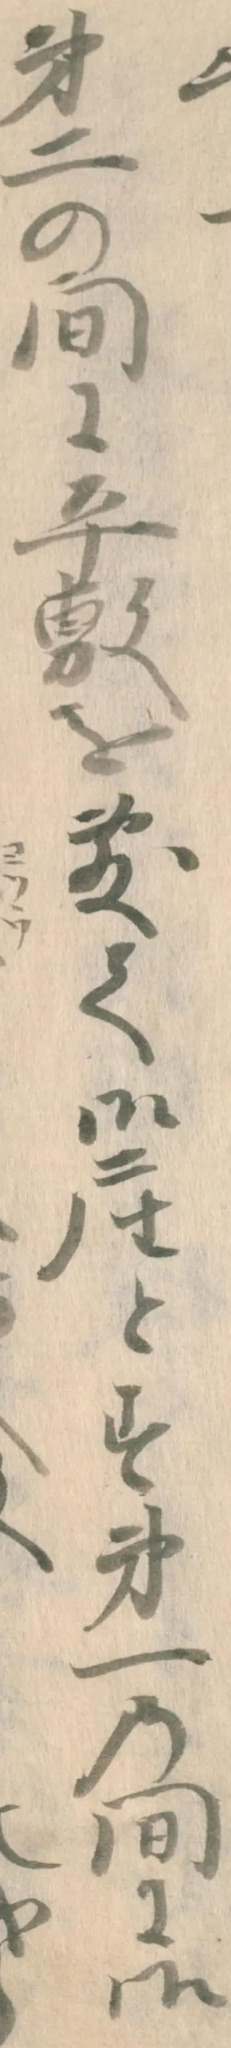第二の間に平敷を敷て御座とす第一の間に御
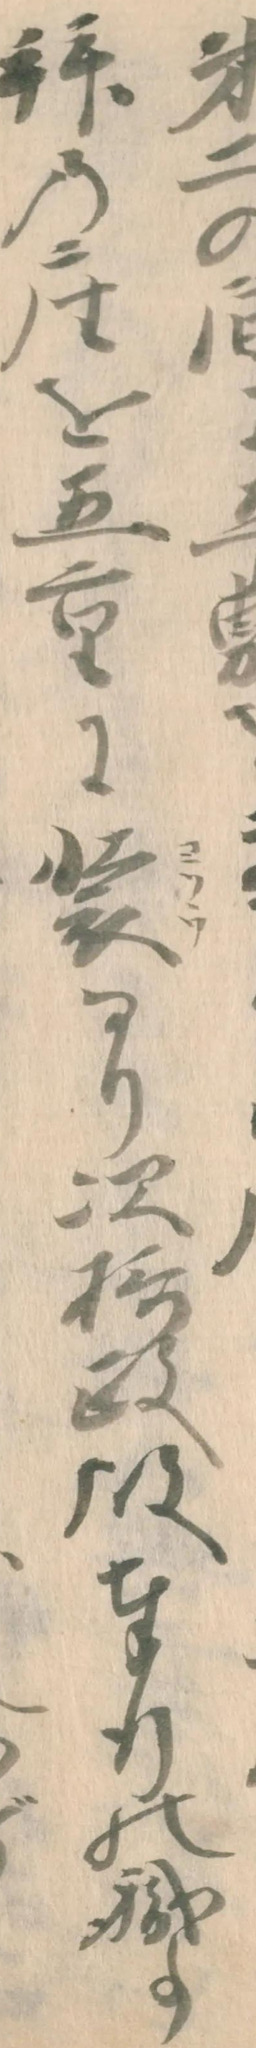拝の座を五重に装なり次摂政殿奉行の職事
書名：賀茂社記録. 第1冊
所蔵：国立国会図書館 National Diet Library, JAPAN
